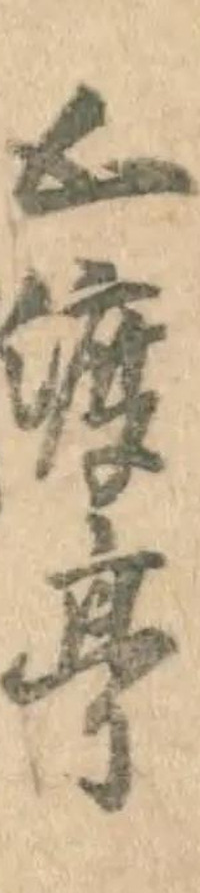五渡亭
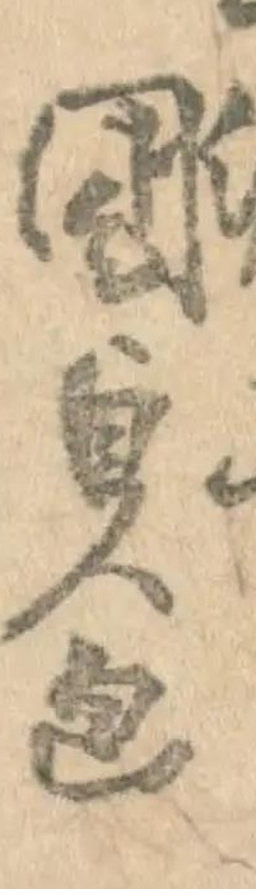国貞画

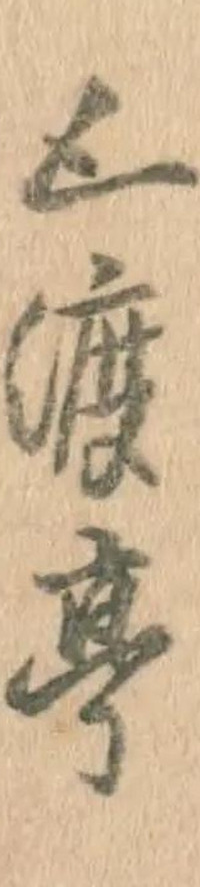五渡亭
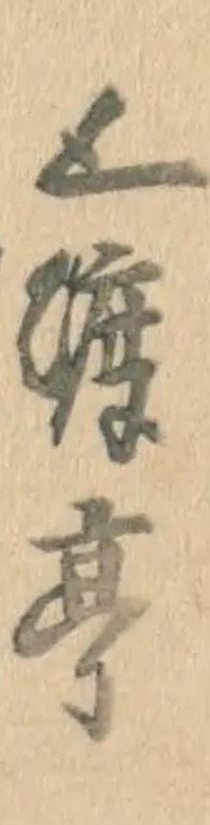五渡亭
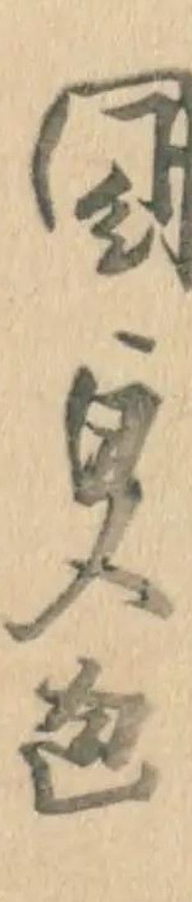国貞画

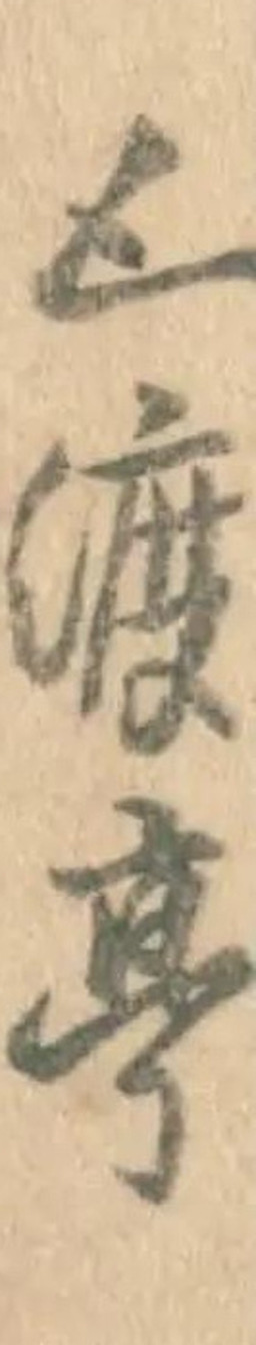五渡亭
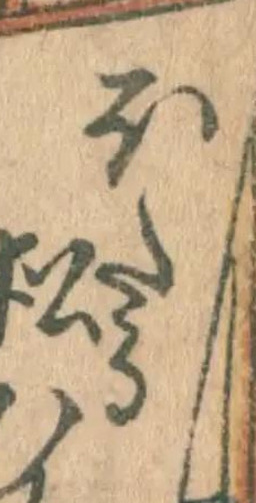ほたる
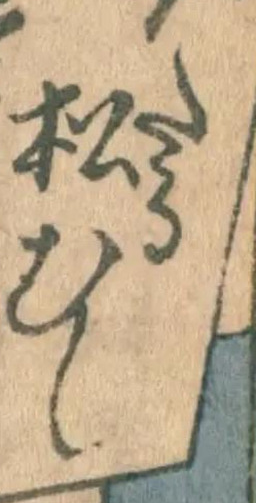松むし
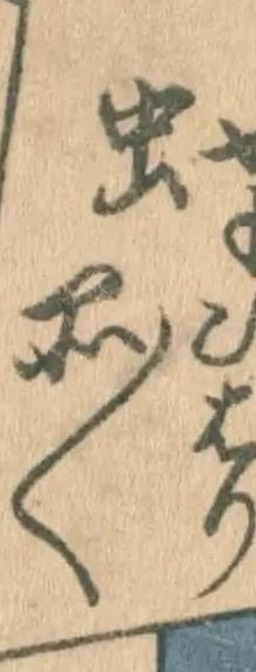虫品〳〵
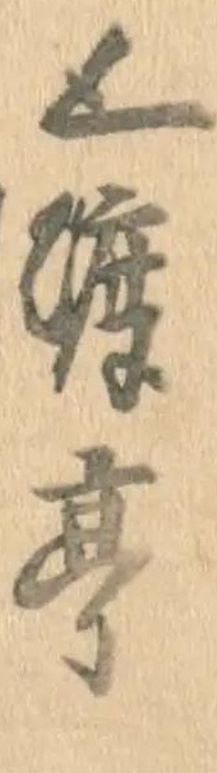五渡亭
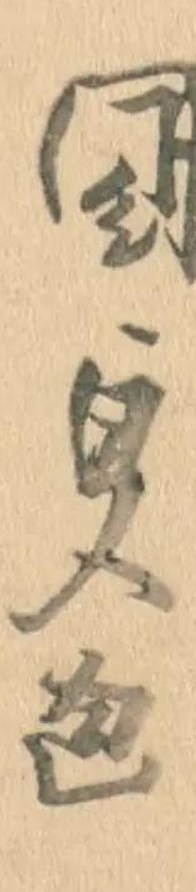国貞画

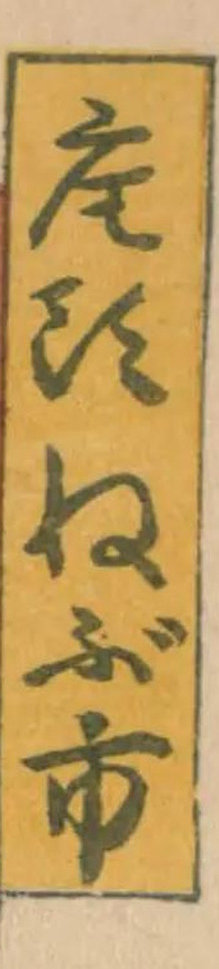座頭ねぶ市
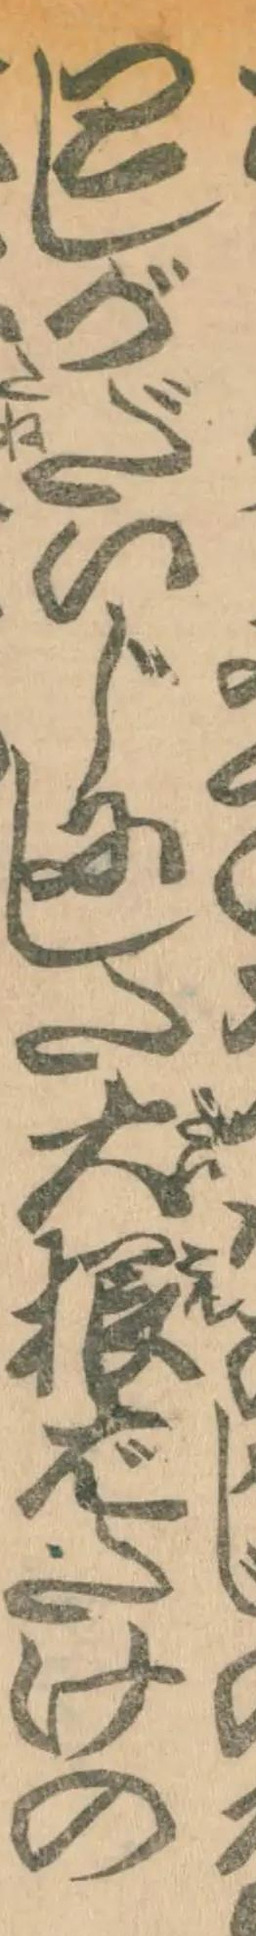わしがだいじにした大根ばたけの
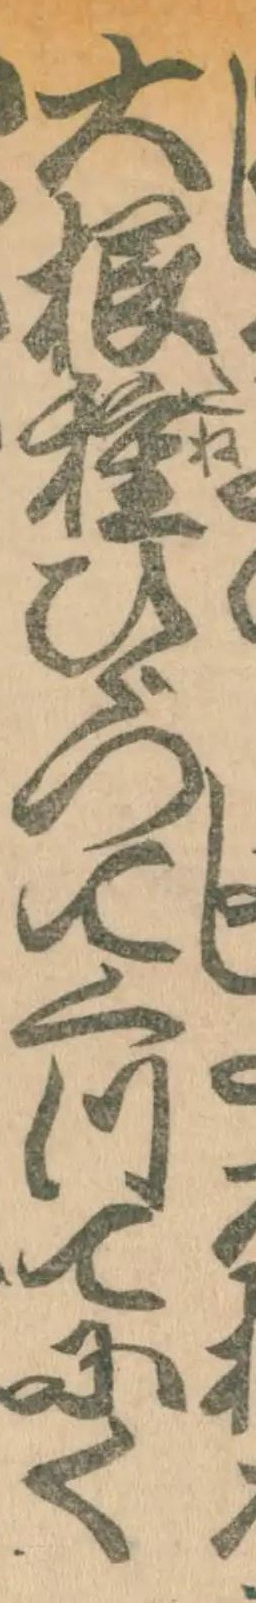大根種ひゞつてくつてにく
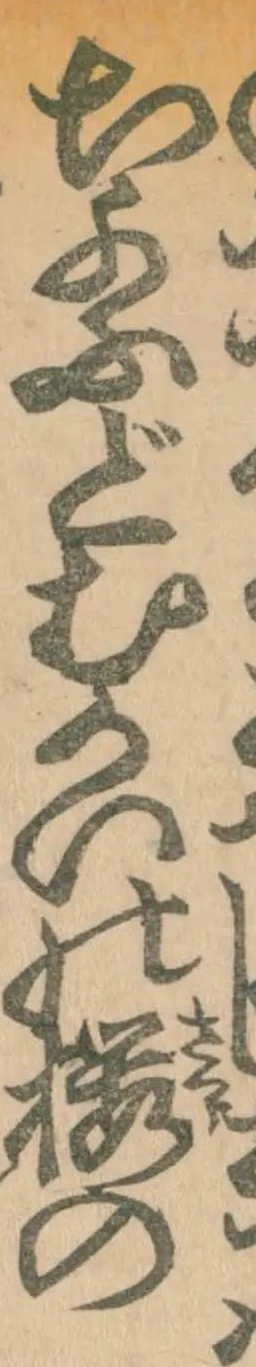ちよふどむかいの桜の
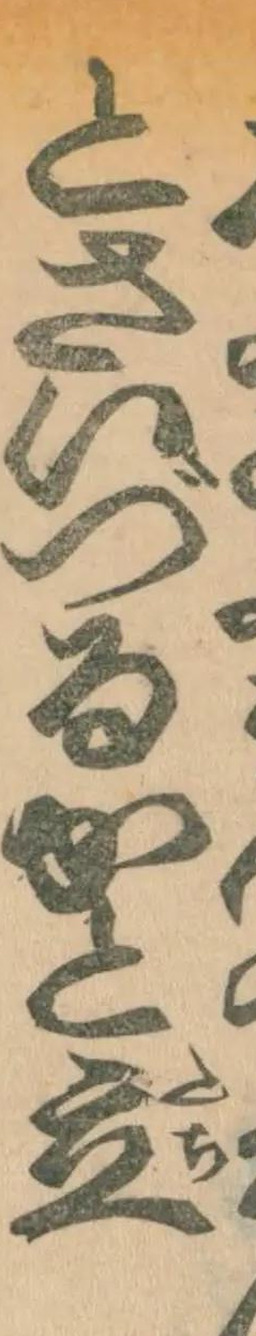とさいづるかと立
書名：国芳国貞錦絵
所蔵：国立国会図書館 National Diet Library, JAPAN
